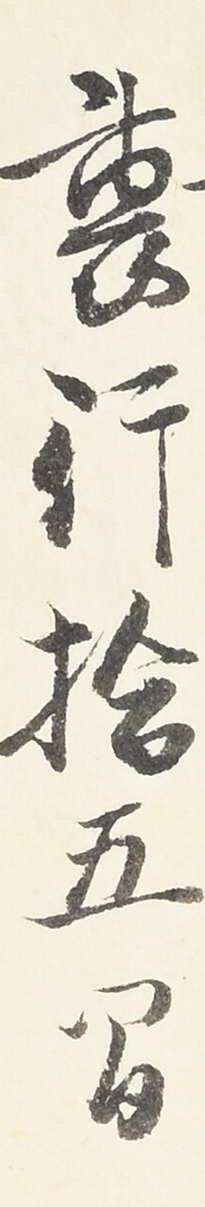裏行拾五間

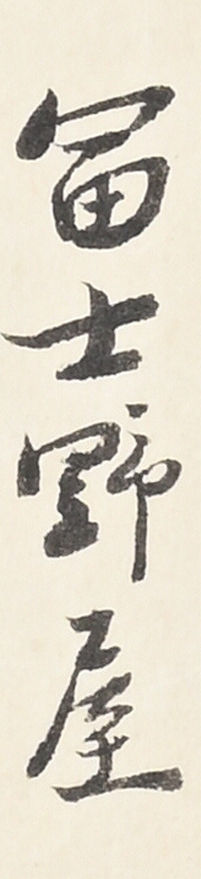冨士野屋
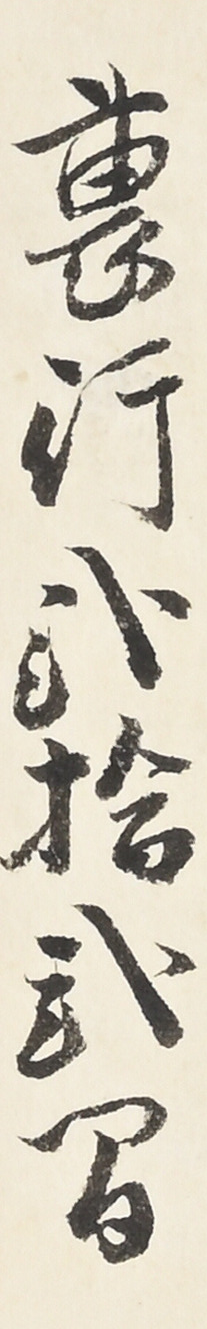裏行弐拾弐間
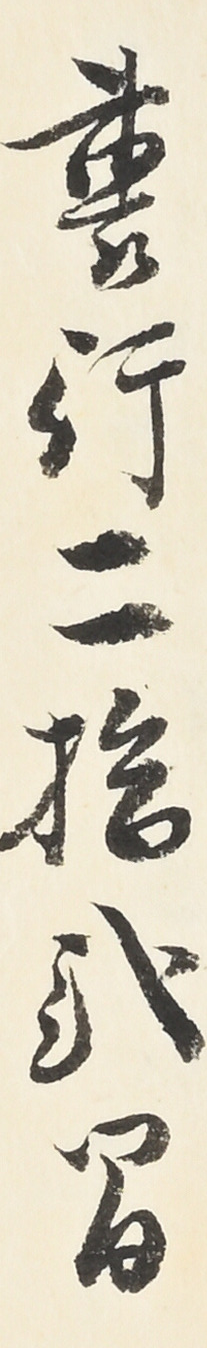裏行二拾弐間
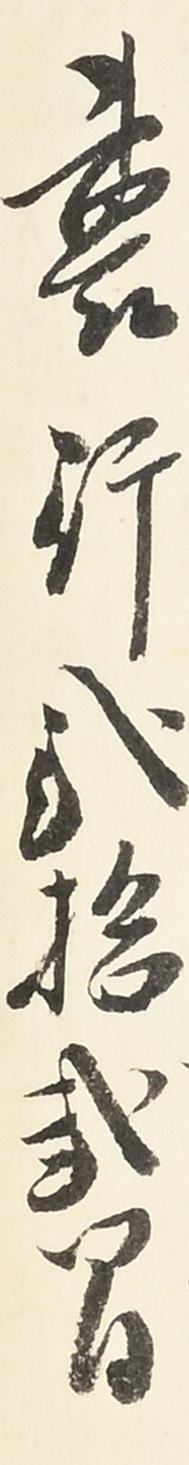裏行弐拾弐間
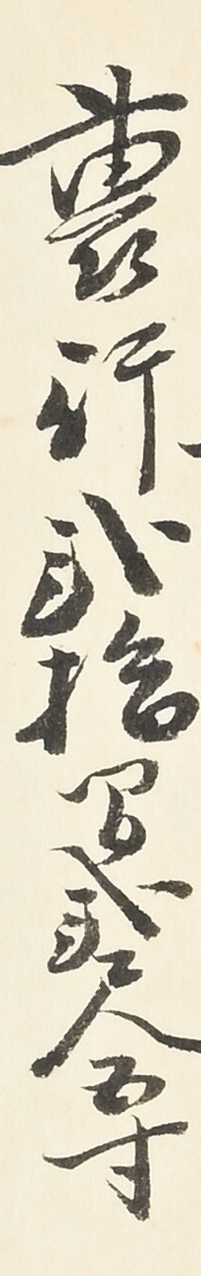裏行弐拾間弐尺五寸
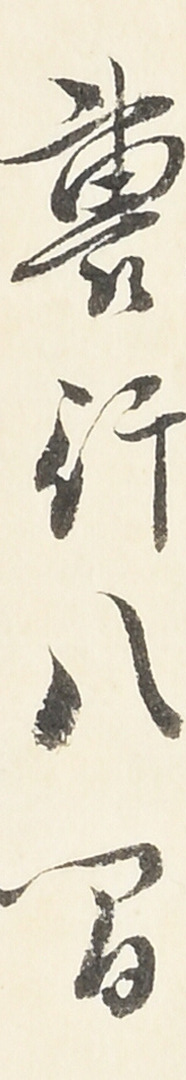裏行八間

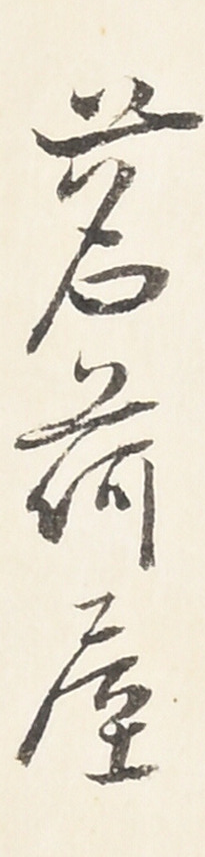茗荷屋
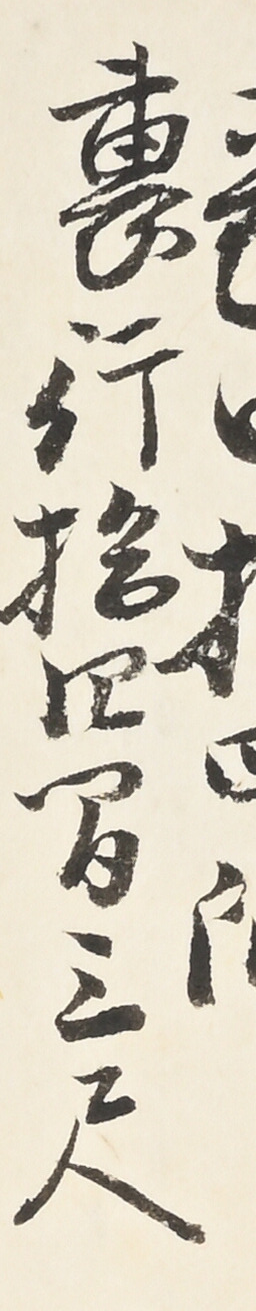裏行拾四間三尺
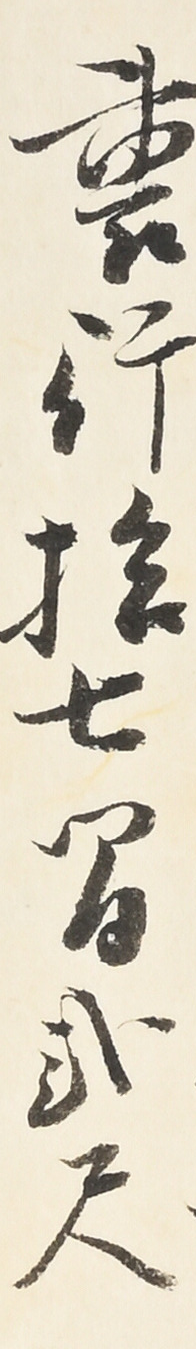裏行拾七間弐尺
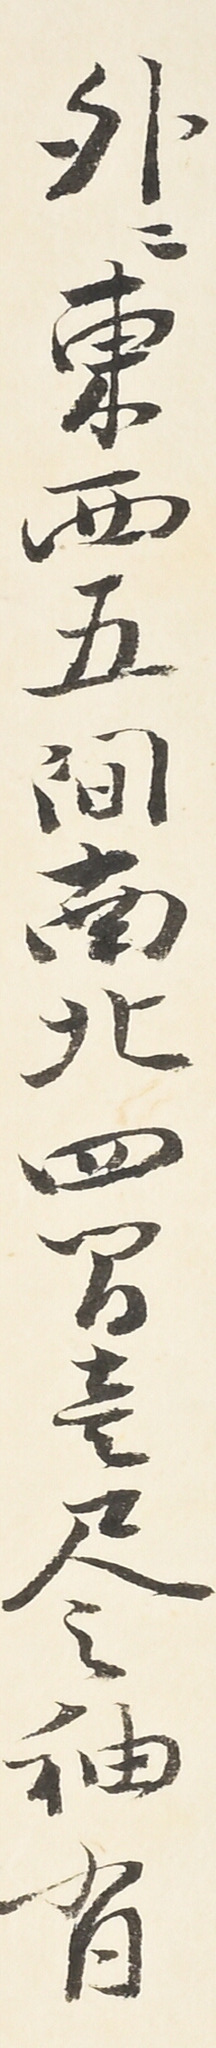外ニ東西五間南北四間壱尺之袖有
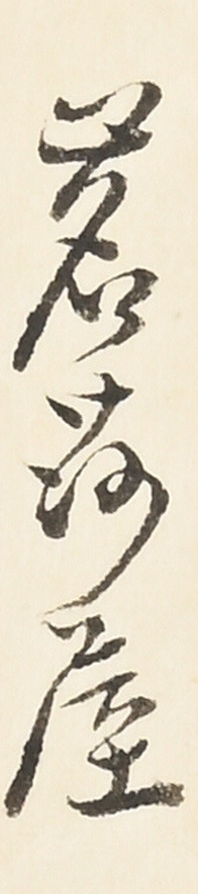茗荷屋
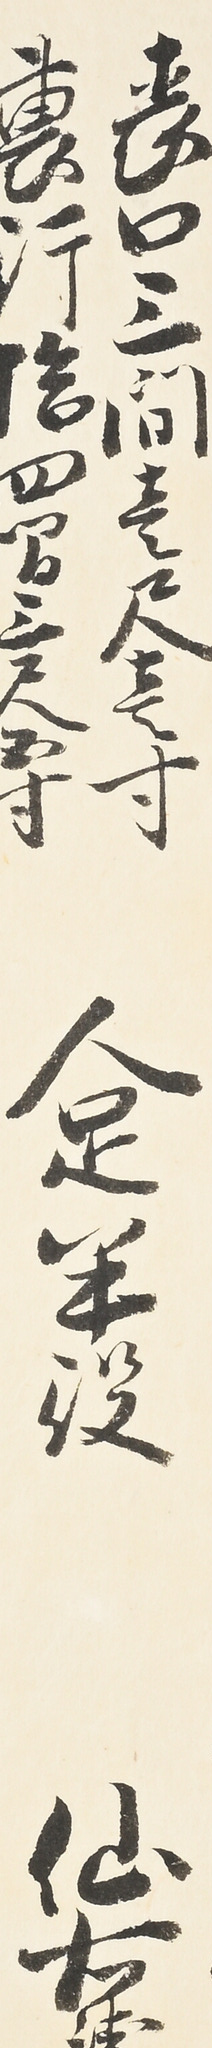一表口三間壱尺壱寸人足半役仙右衛門㊞
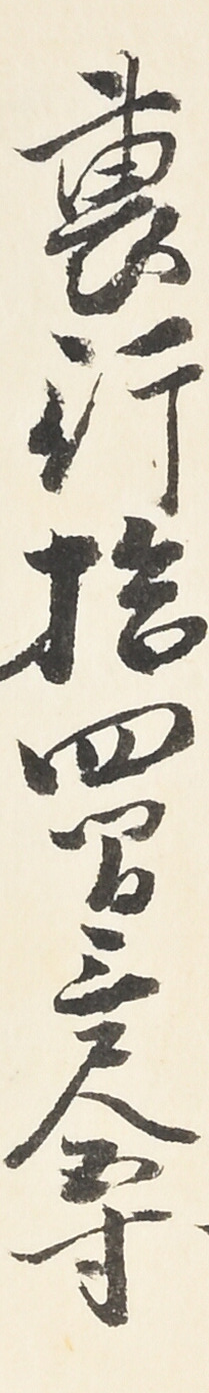裏行拾四間三尺五寸
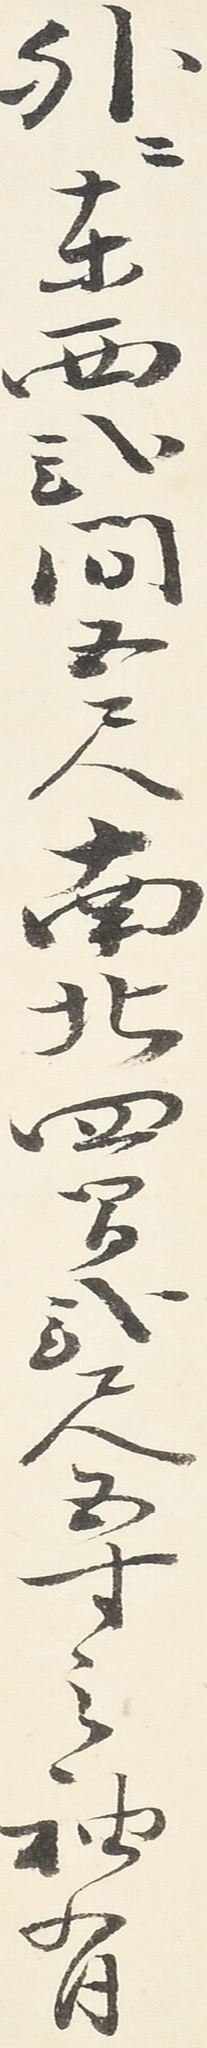外ニ東西弐間五尺南北四間弐尺五寸之袖有
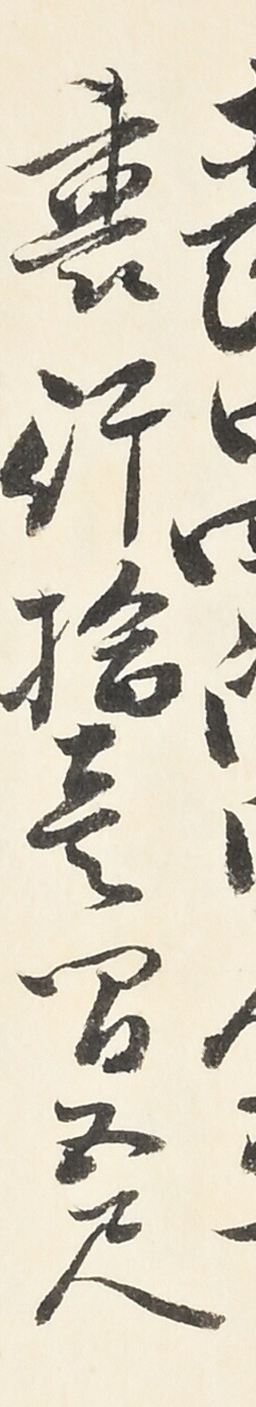裏行拾壱間五尺
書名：高遠町家数并間数改帳
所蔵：伊那市立高遠町図書館・合同会社AMANE
